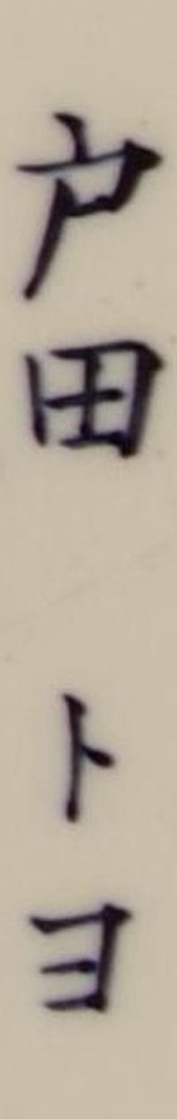戸田トヨ
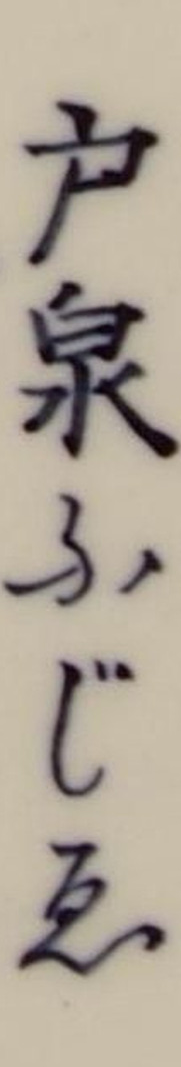戸泉ふじゑ
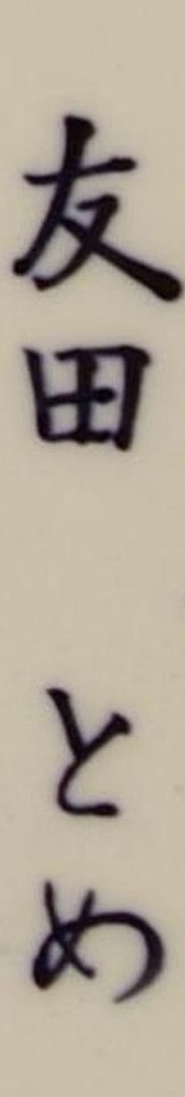友田とめ
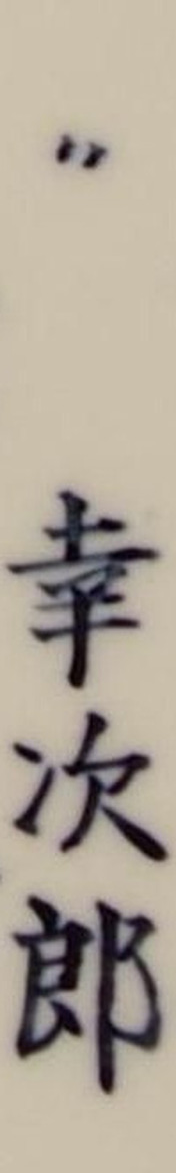幸次郎
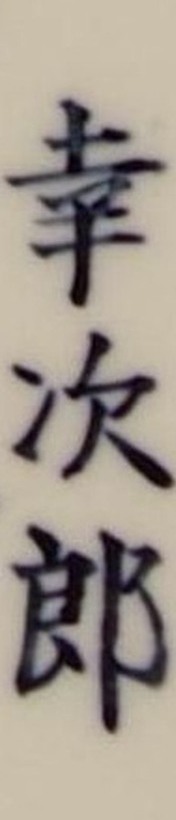幸次郎
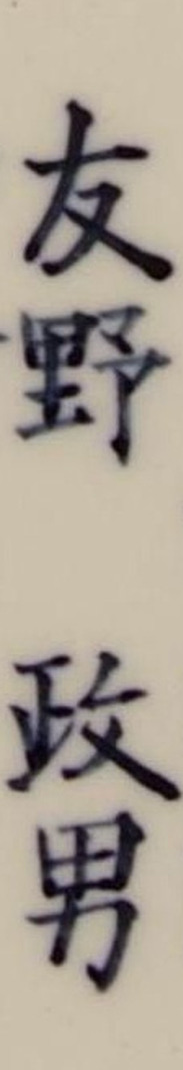友野政男
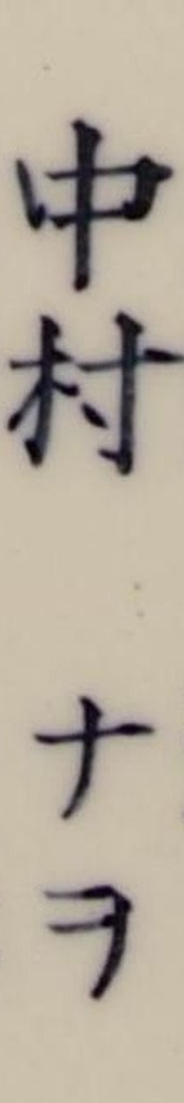中村ナヲ
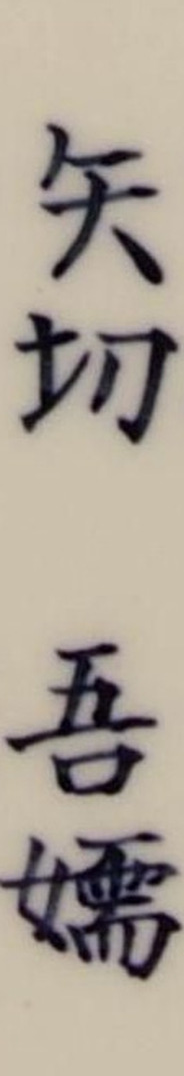矢切吾嬬
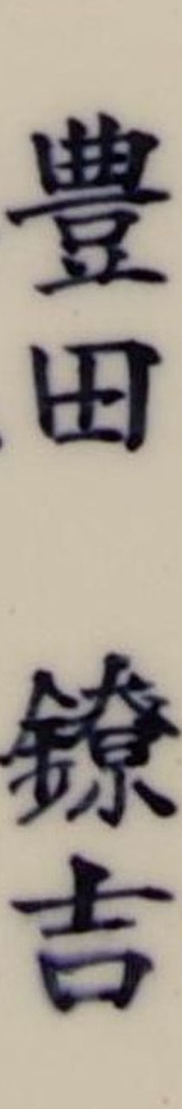豊田鐐吉
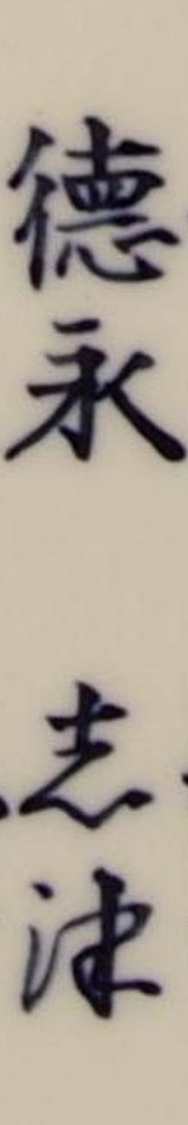徳永志津
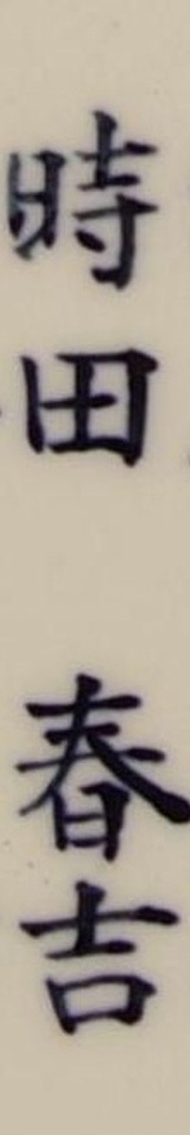時田春吉
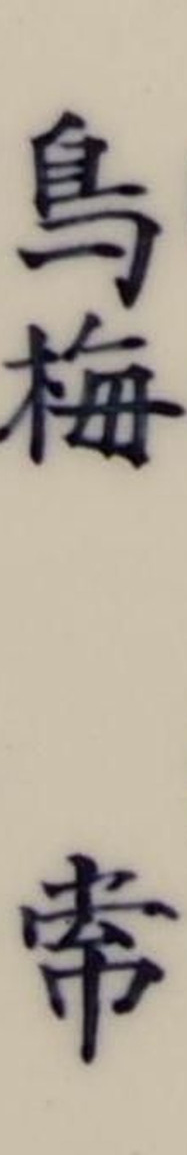烏梅常
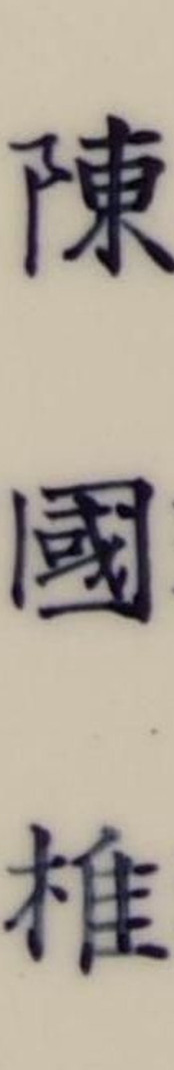陳国椎

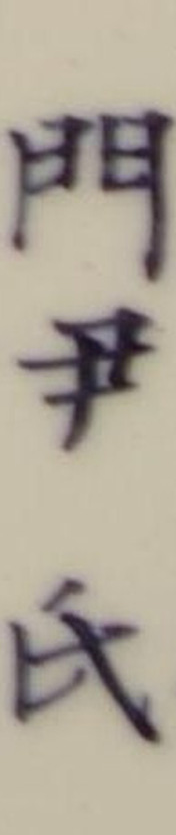門伊氏
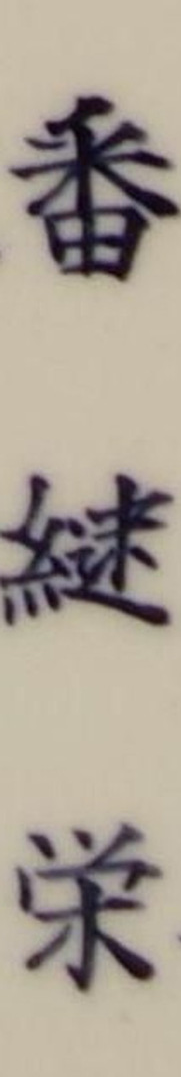番継栄
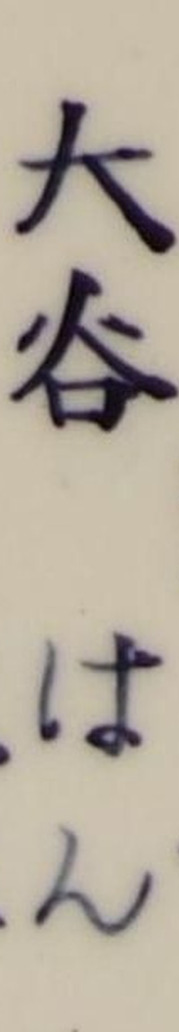大谷はん
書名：M~S
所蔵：高野山金剛峯寺
